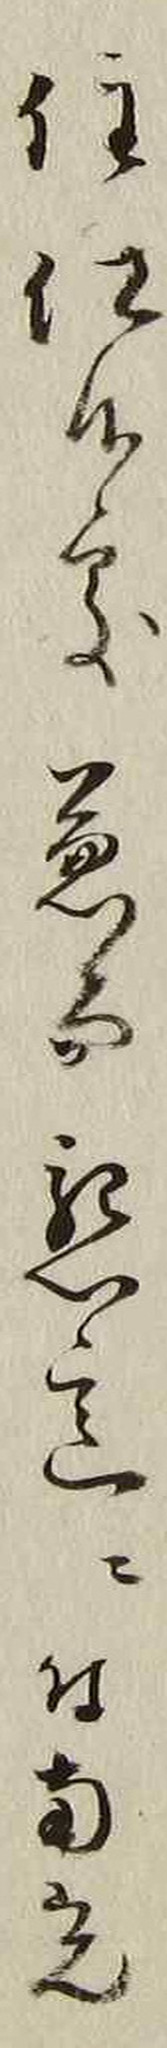住仕候処兼而懇意に付南光
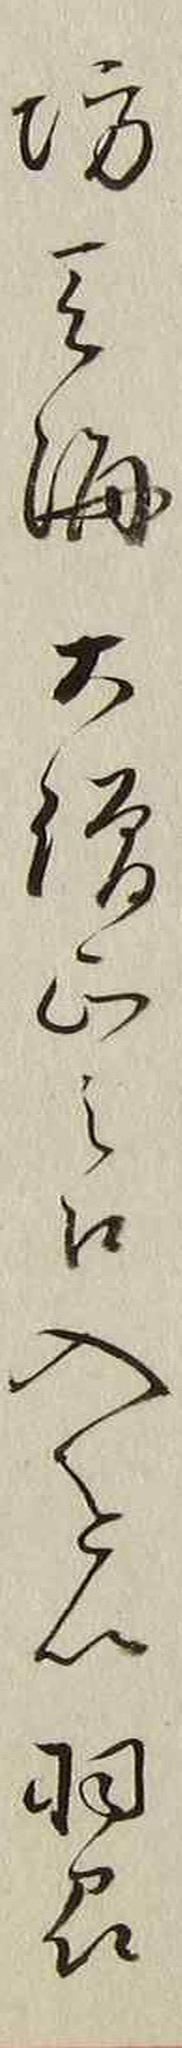坊天海大僧正之口入を以羽州
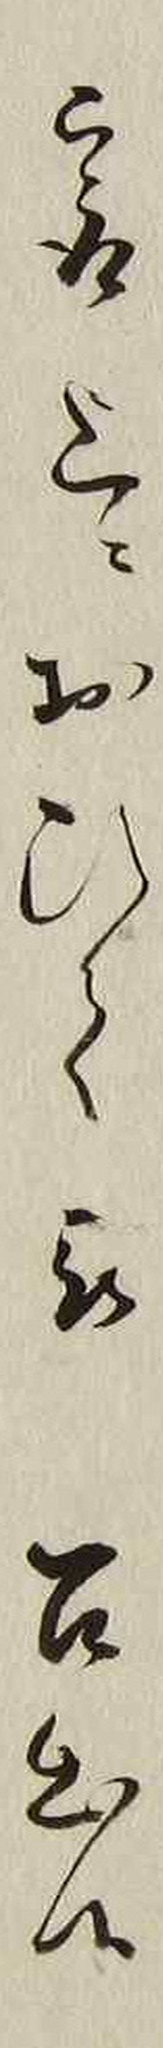最上におひて被召出候
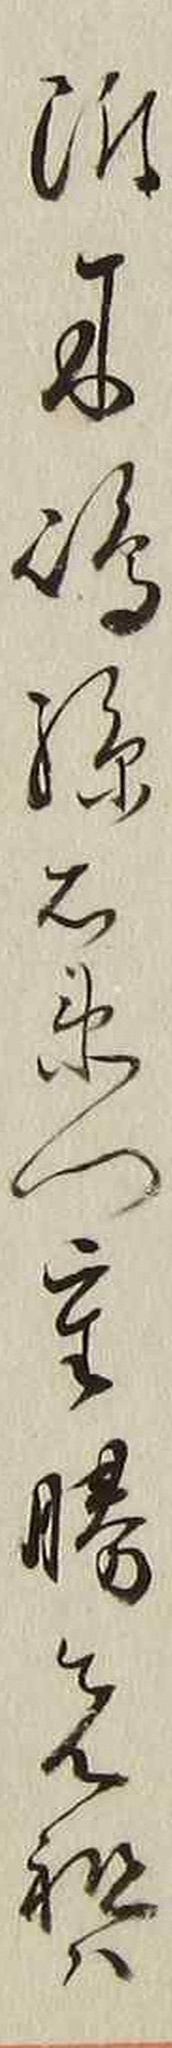附来嶋孫右右衛門重勝先祖は
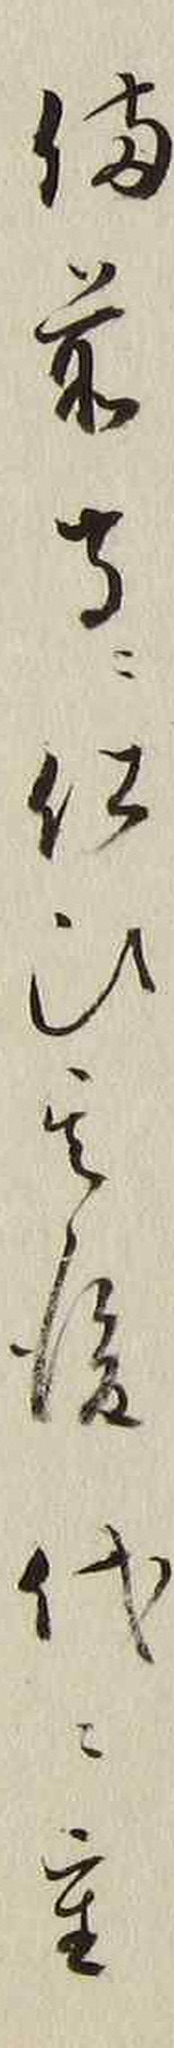備前守に仕ひ其後代々重
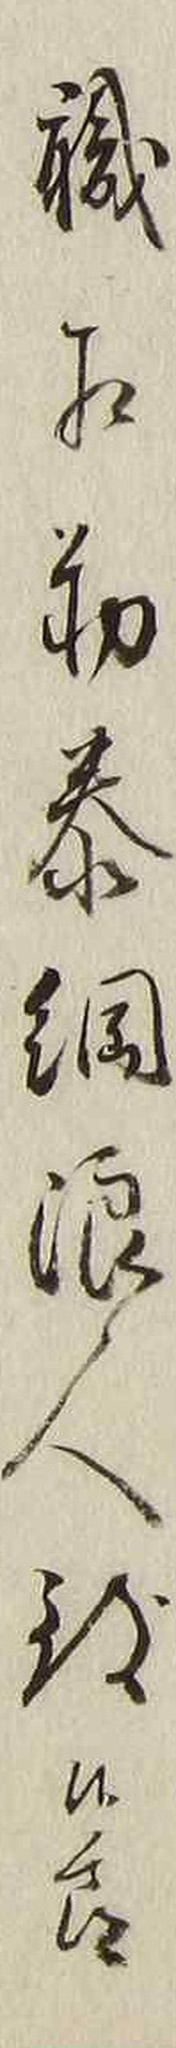職相勤泰網浪人致候節
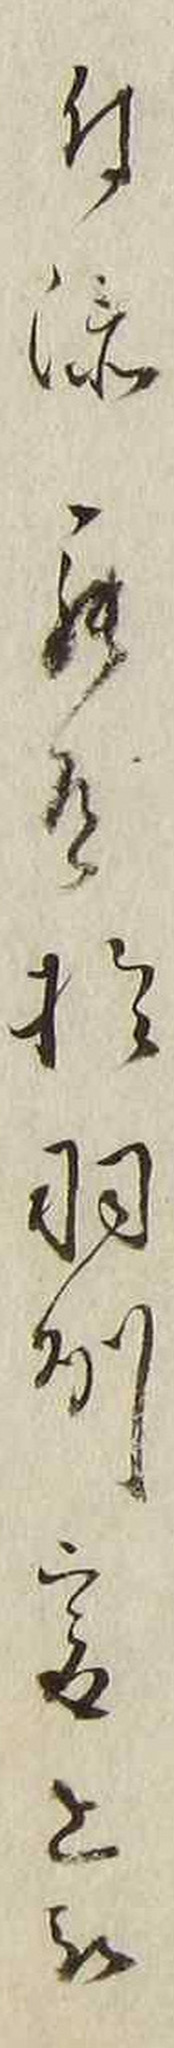付添罷有於羽州最上被

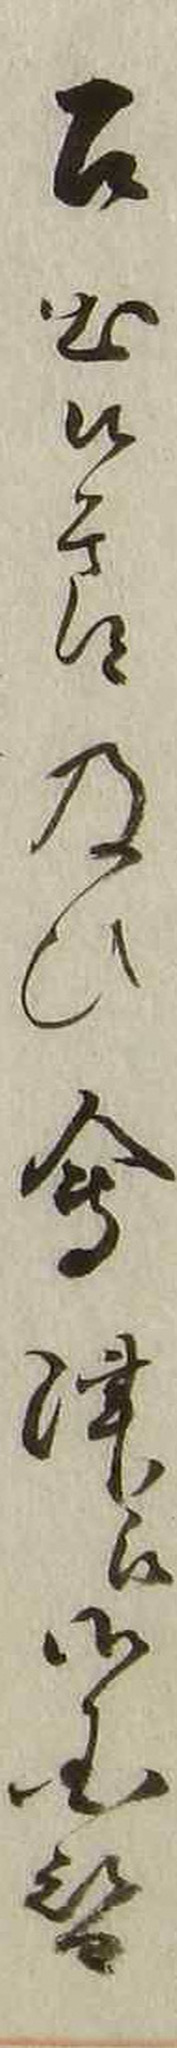召出候節及ひ会津江御国替
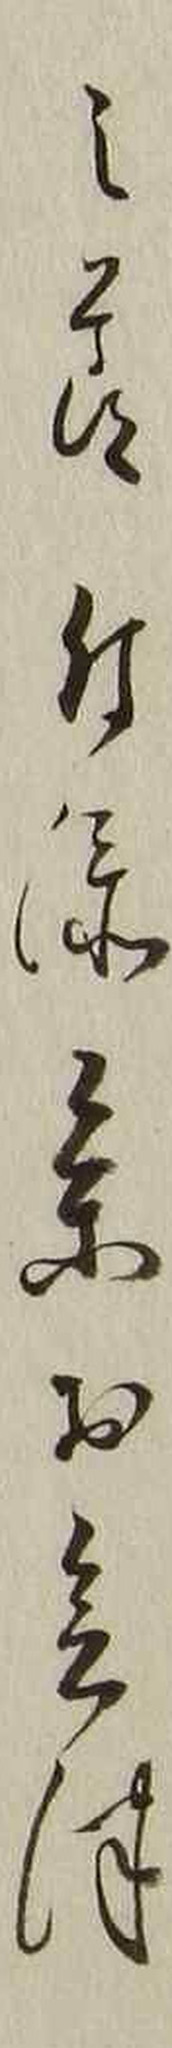之節付添参於会津
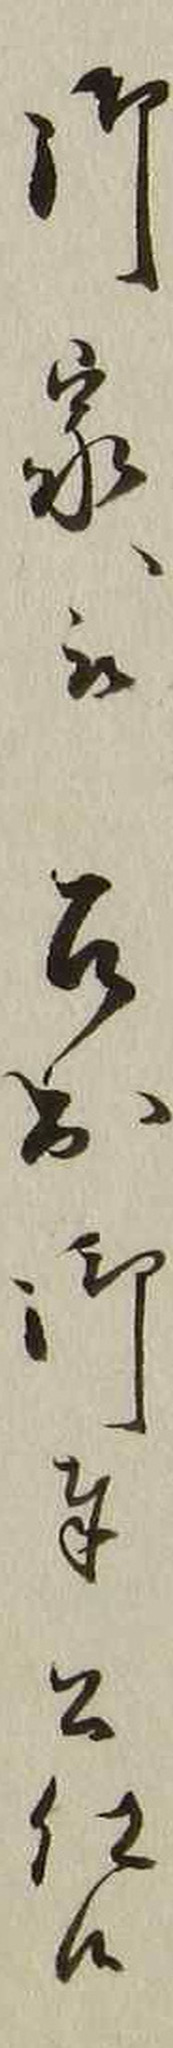御家へ被召出御奉公仕候
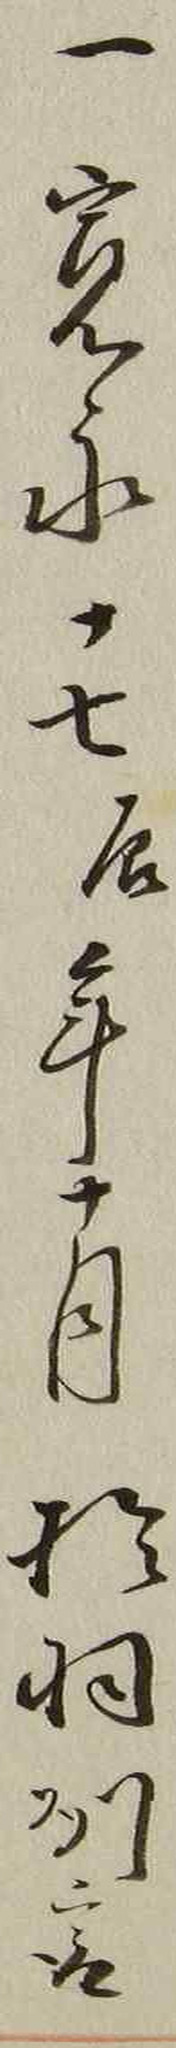一寛永十七辰年十月於羽州最
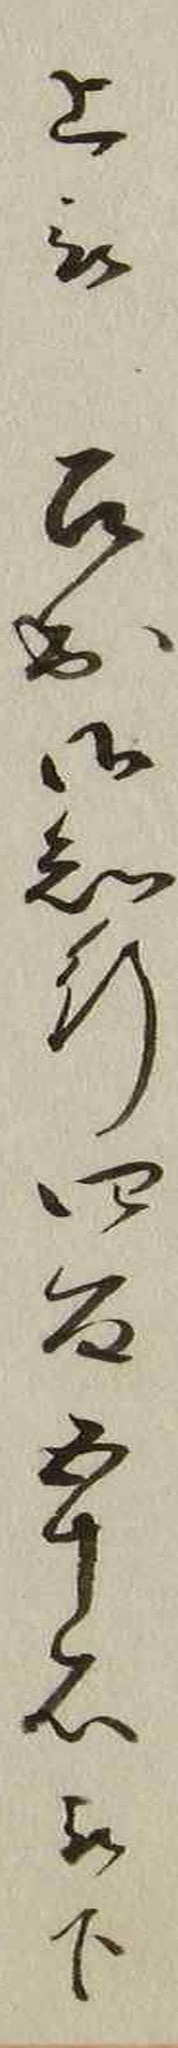上被召出御知行四百五十石被下
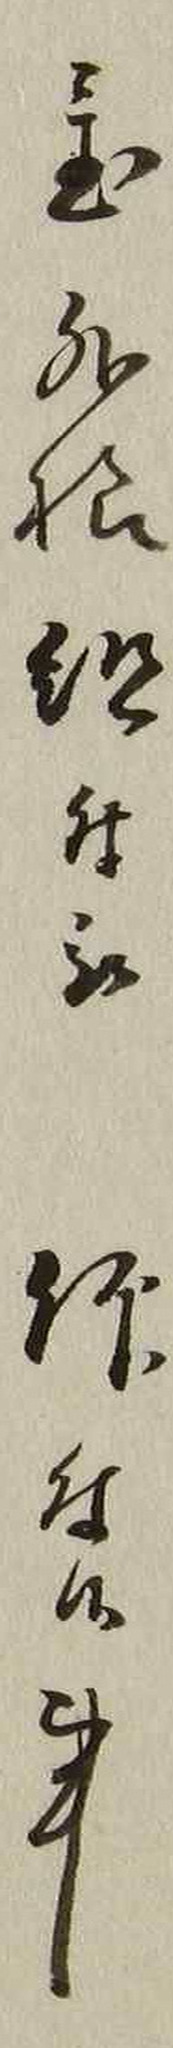置外様組付被仰付候事
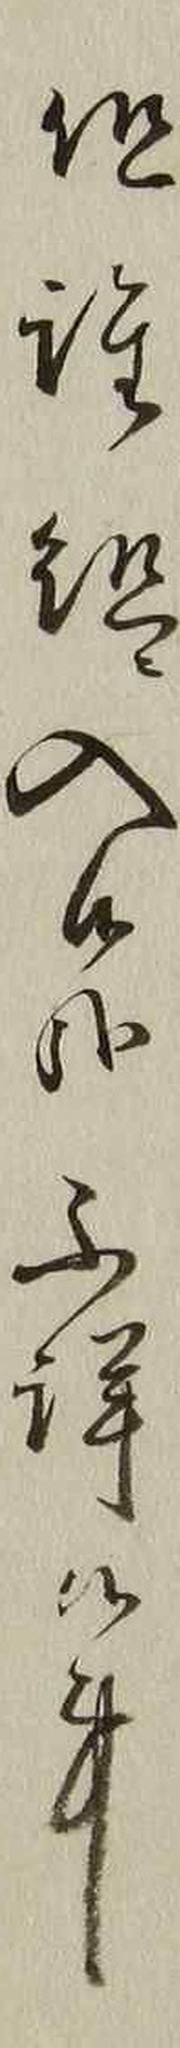但誰組に入候哉不詳侯事
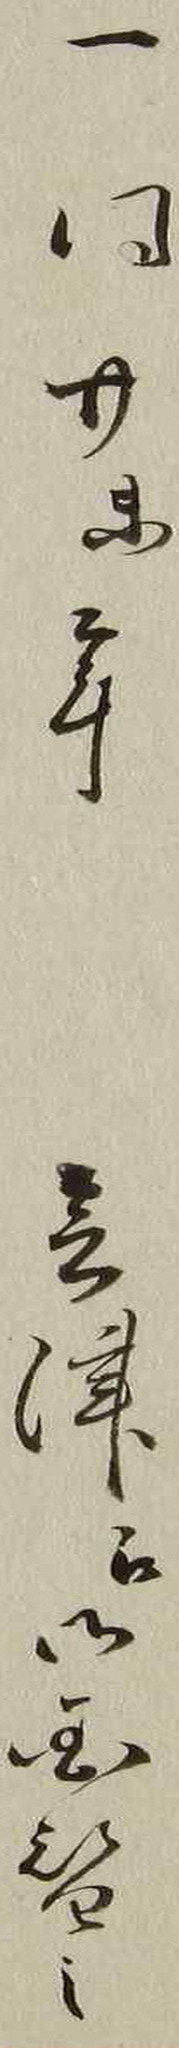一同廿未年会津江御国替之
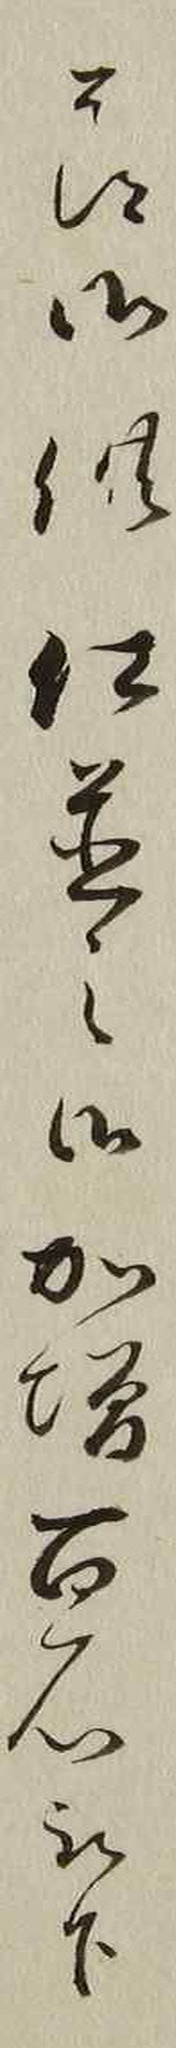節御供仕並之御加増百石被下
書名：諸士系譜　巻之159　な之部1
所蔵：会津若松市立会津図書館
